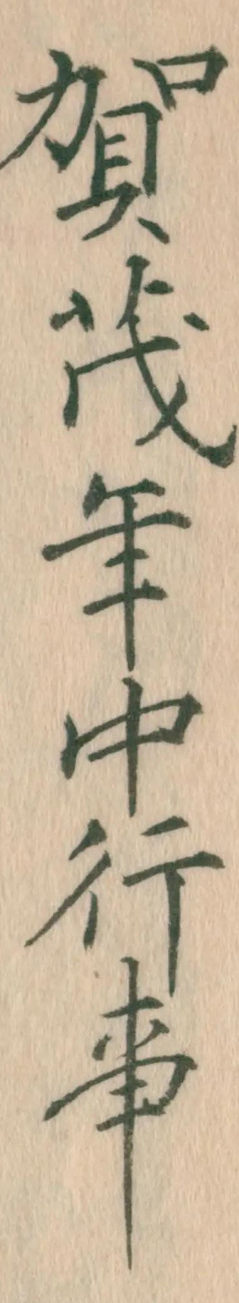賀茂年中行事

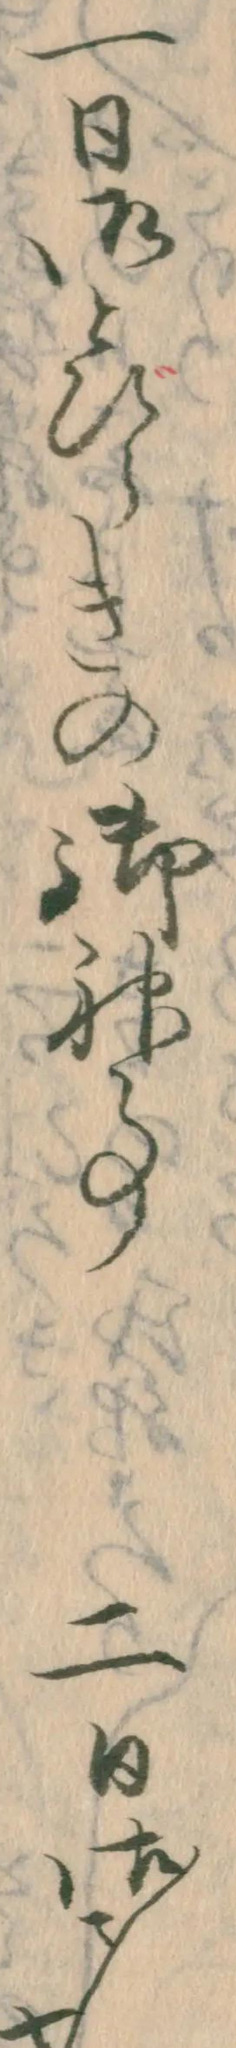正月一日御とびらきの御神事二日御
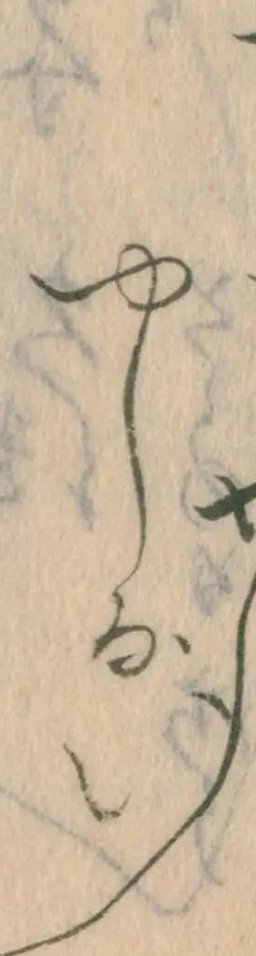やしない
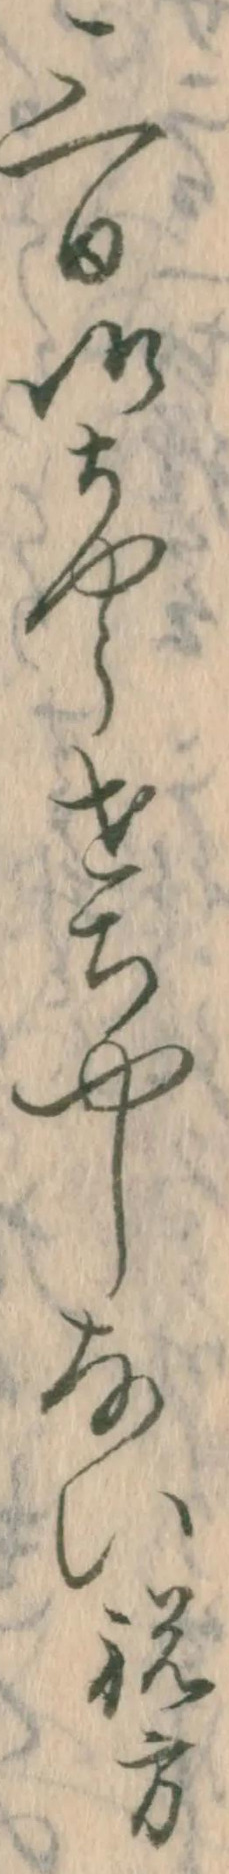三日御ちやうせちやしない祝方
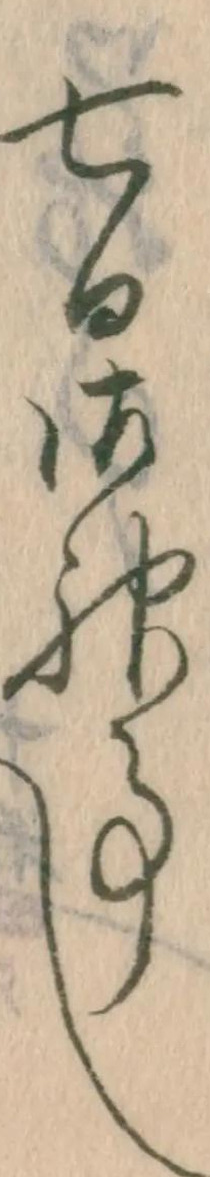七日御神事
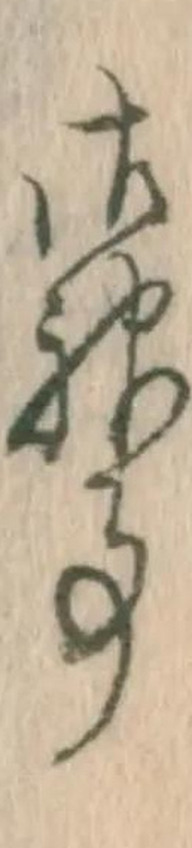御神事
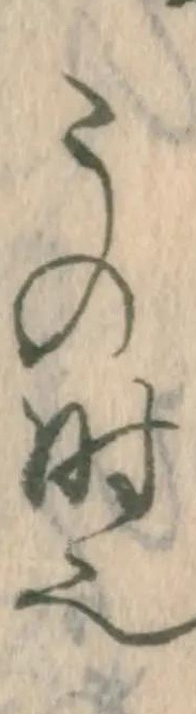うの時也

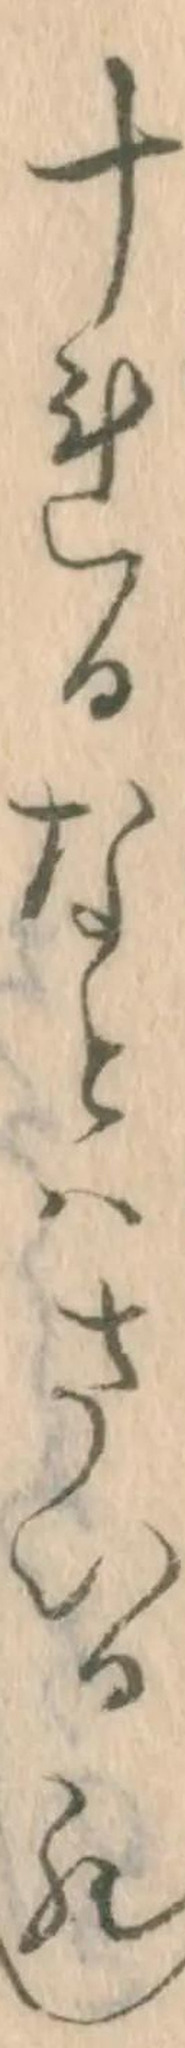十連日なとはまいる歟
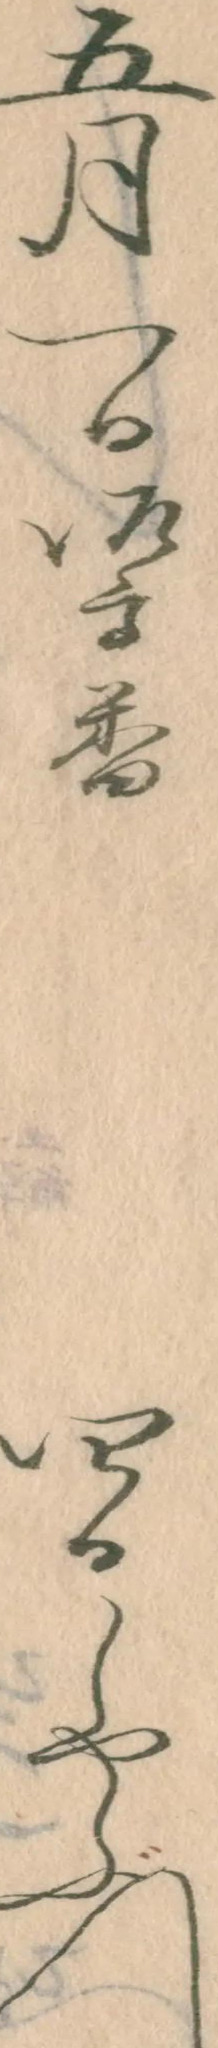五月一日御馬番四日しやぶ
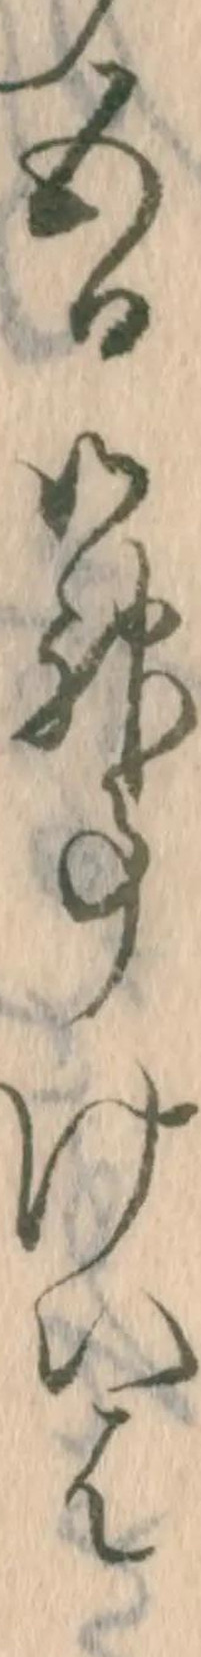五日御神事のけいは
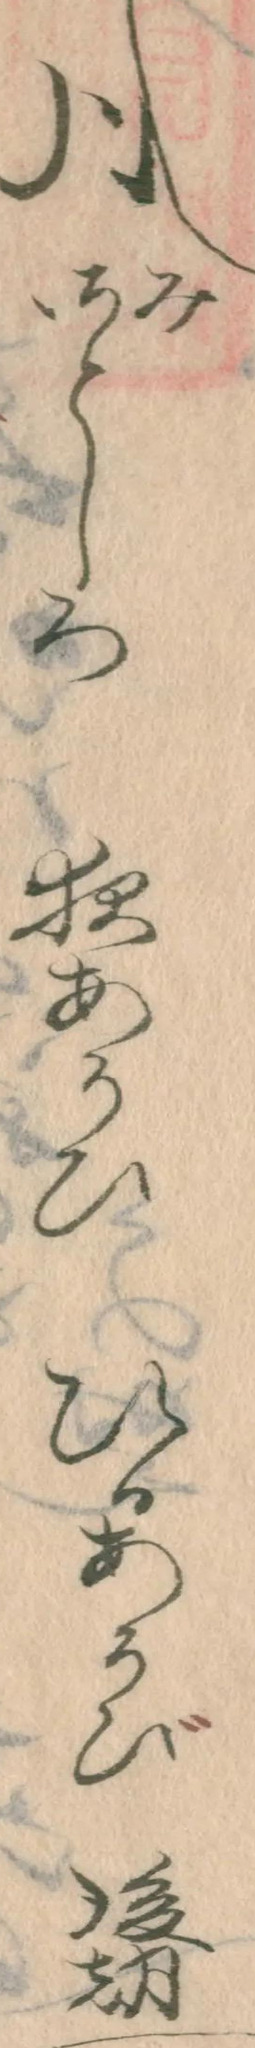月御こしろ夜あそひひるあそび後朝
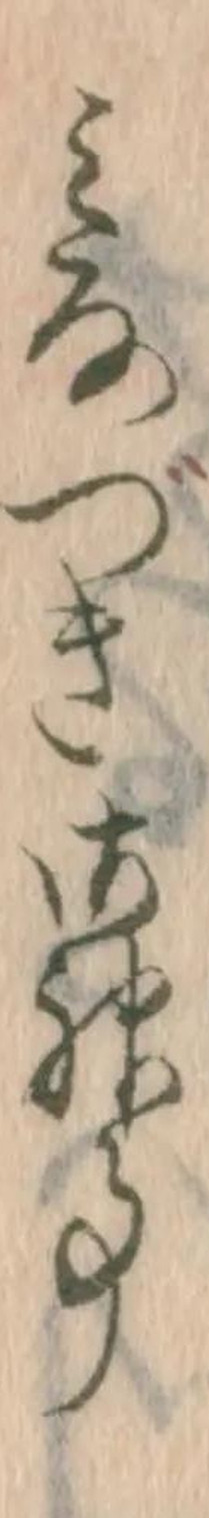みなづき御神事
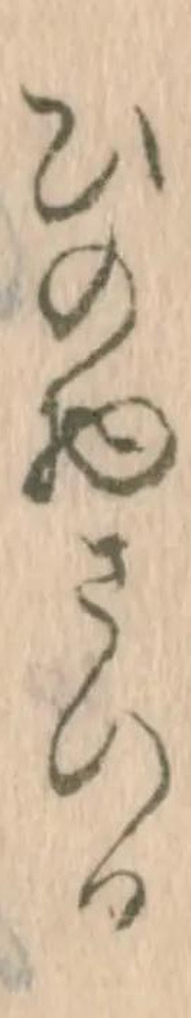ひの物まいる
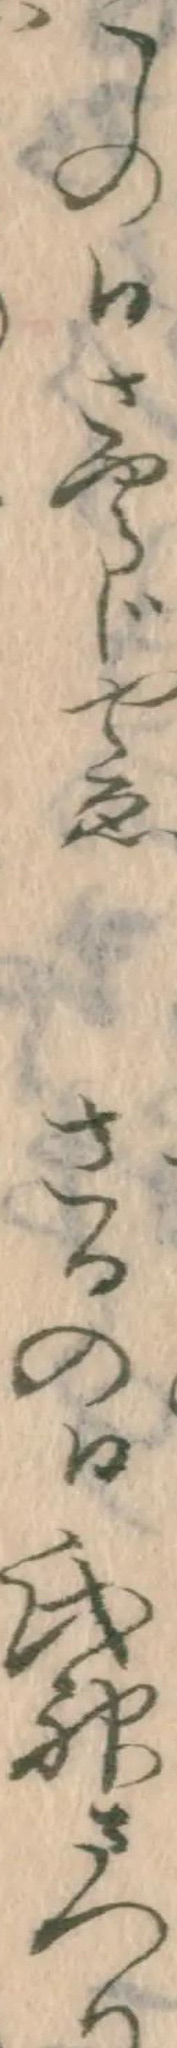この日さゆらじやゑさるの日氏神まつり
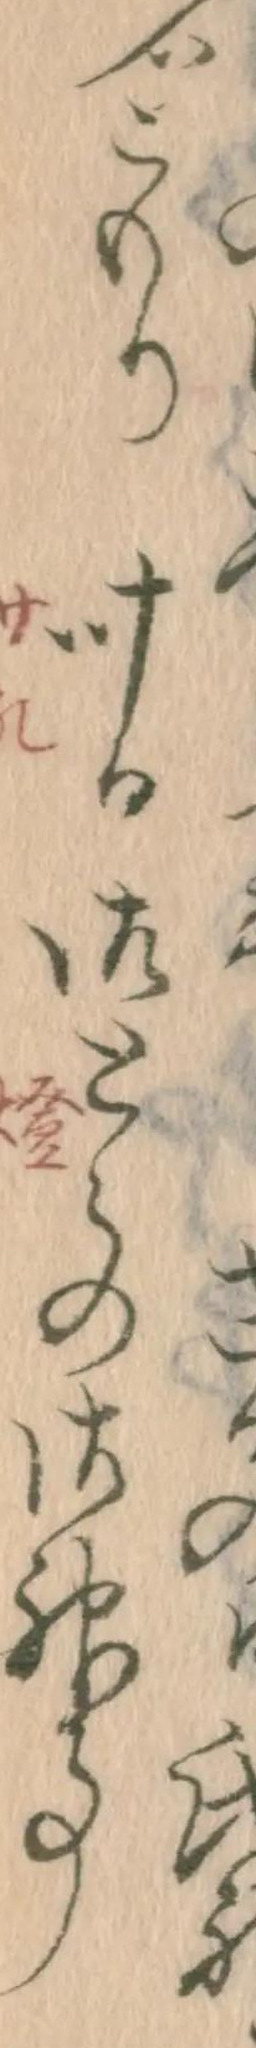いこもり日御とうの御神事
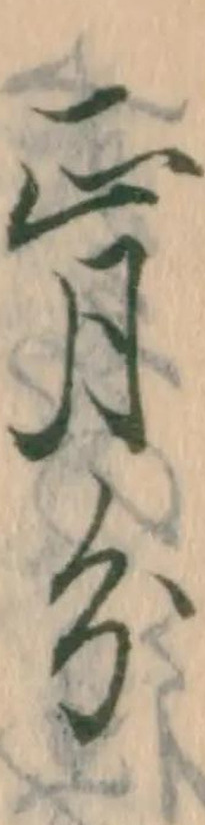正月分
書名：賀茂社記録. 第3冊
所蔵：国立国会図書館 National Diet Library, JAPAN
